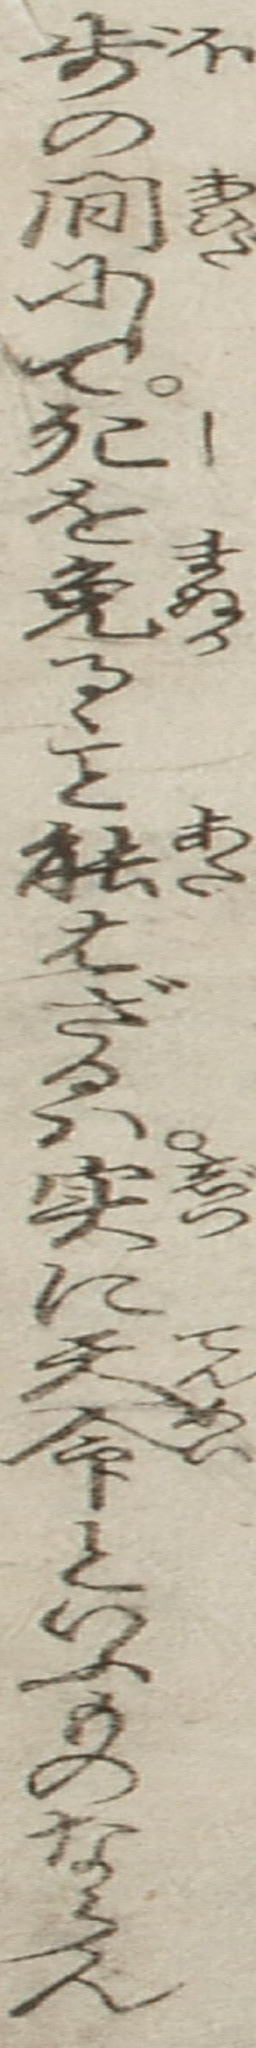歩の間にして。死を免るゝこと能はざるは。実に天命といふものならん

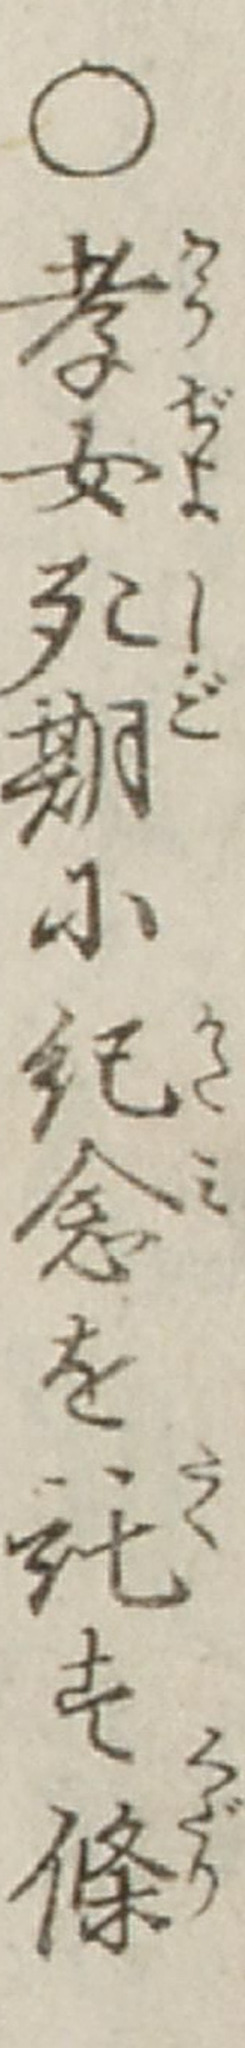〇孝女死期に紀念を託す條
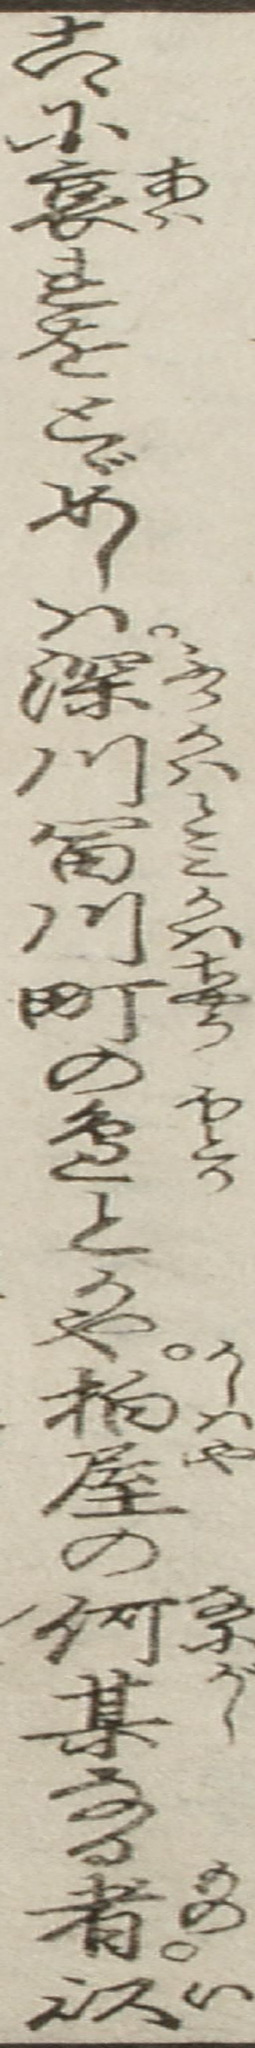こゝに哀れをとゞめしは。深川冨川町の辺とかや。柏屋の何某なる者。以
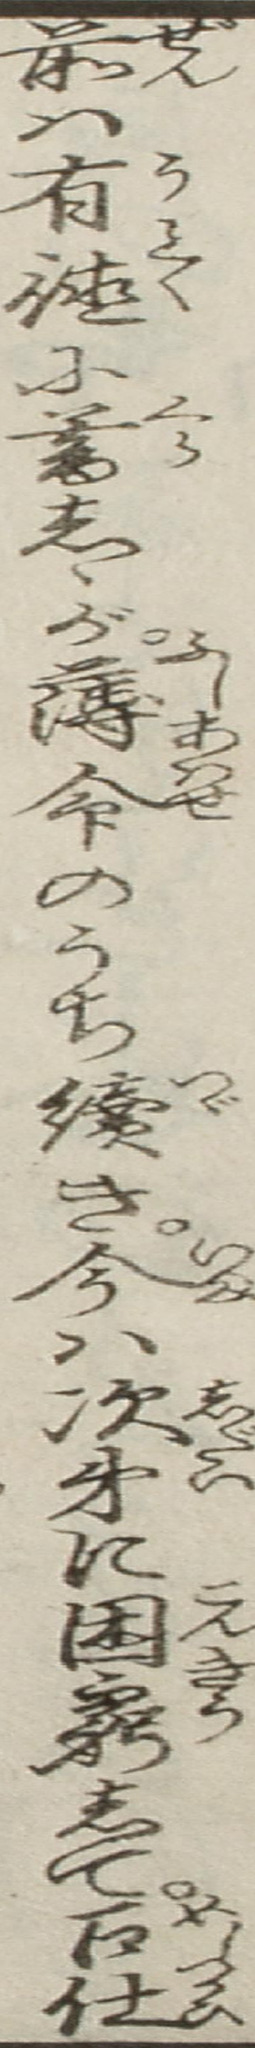前は有徳に暮しゝが。薄命のうち続き。今は次第に困窮して。召仕
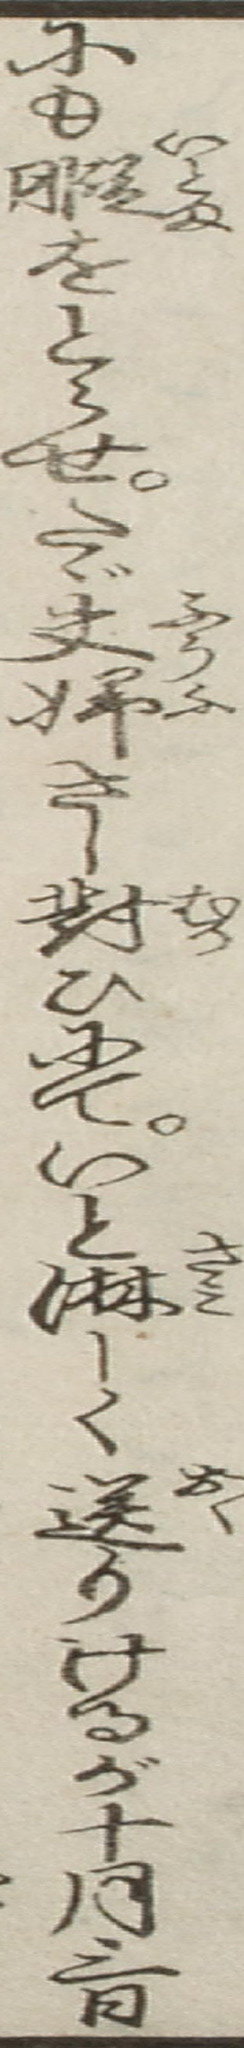にも暇をとらせ。たゞ夫婦さし對ひにて。いと淋しく送りけるが十月三日
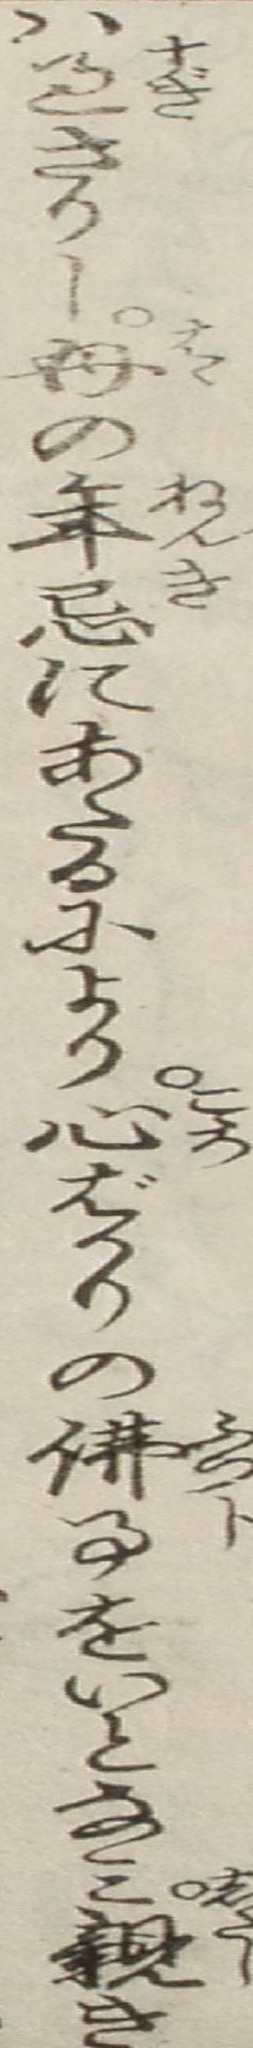は過さりし。母の年忌にあたるにより。心ばかりの佛事をいとなみ。親き
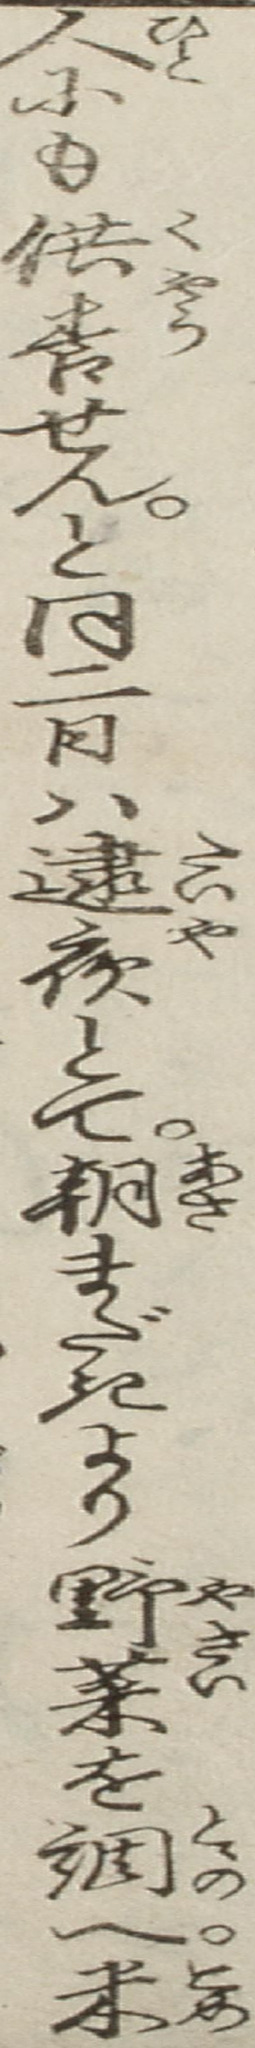人にも供養せん。と同二日は逮夜とて。朝まだきより野菜を調へ。米
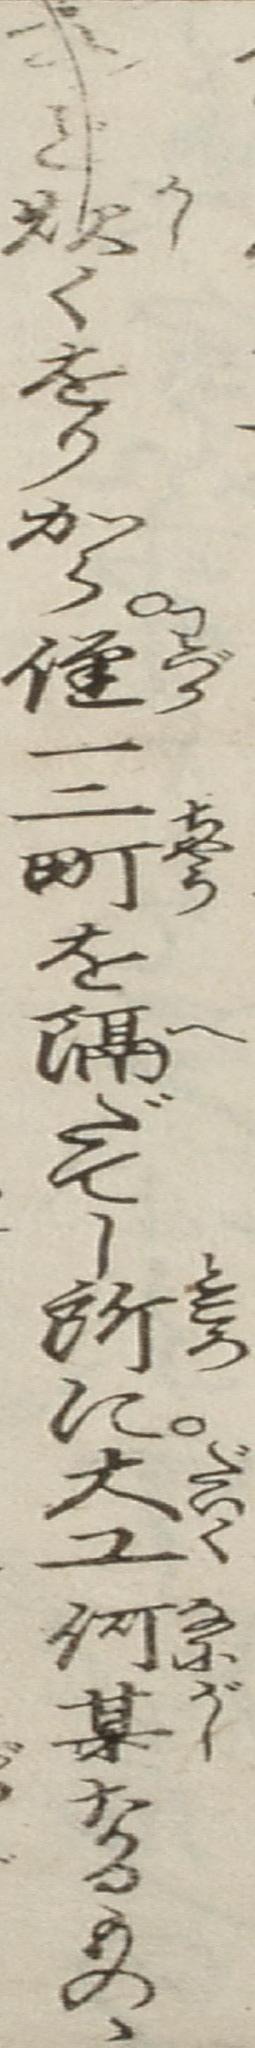など炊くをりから。僅一二町を隔だてし所に。大工何某なるものゝ
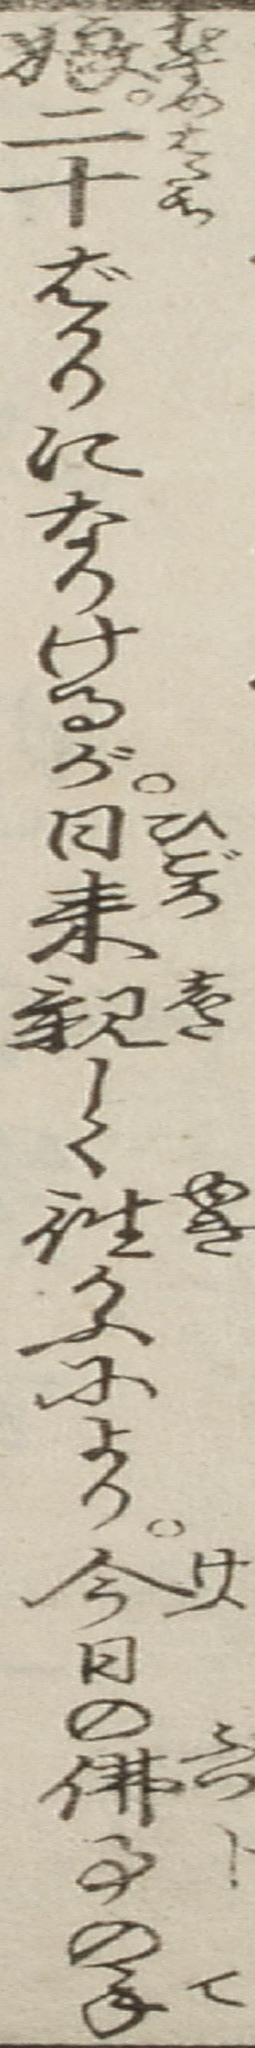娘二十ばかりになりけるが。日来親しく往かふにより。今日の佛事の手
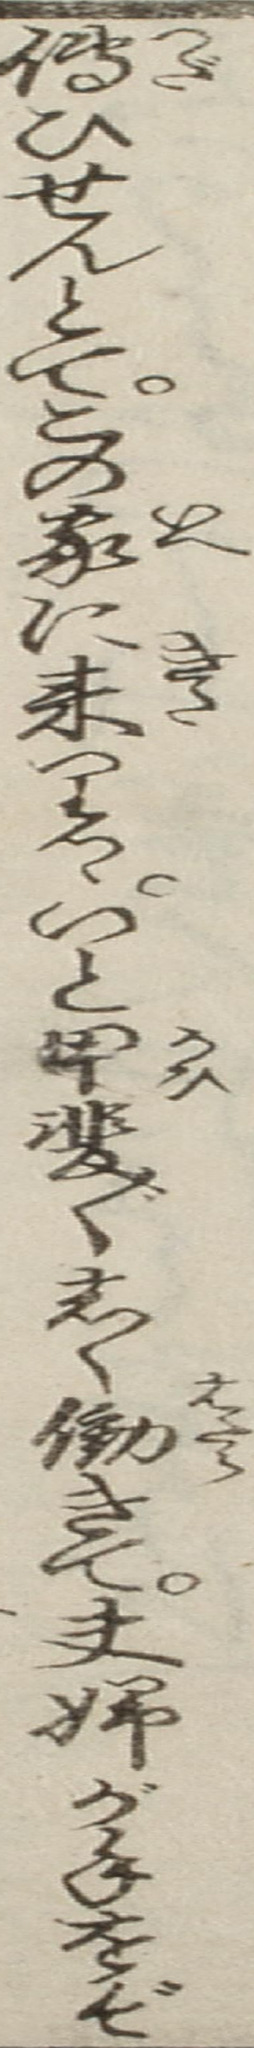傳ひせんとて。この家に来りつゝ。いと甲斐〴〵しく働きて。夫婦が手をぞ
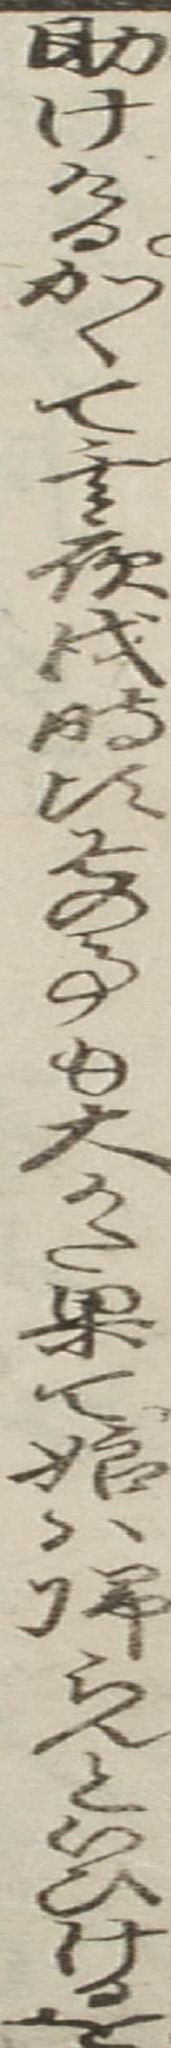助けける。かくて其夜戌時頃。その事も大かた果て娘は帰らんといひけるを。
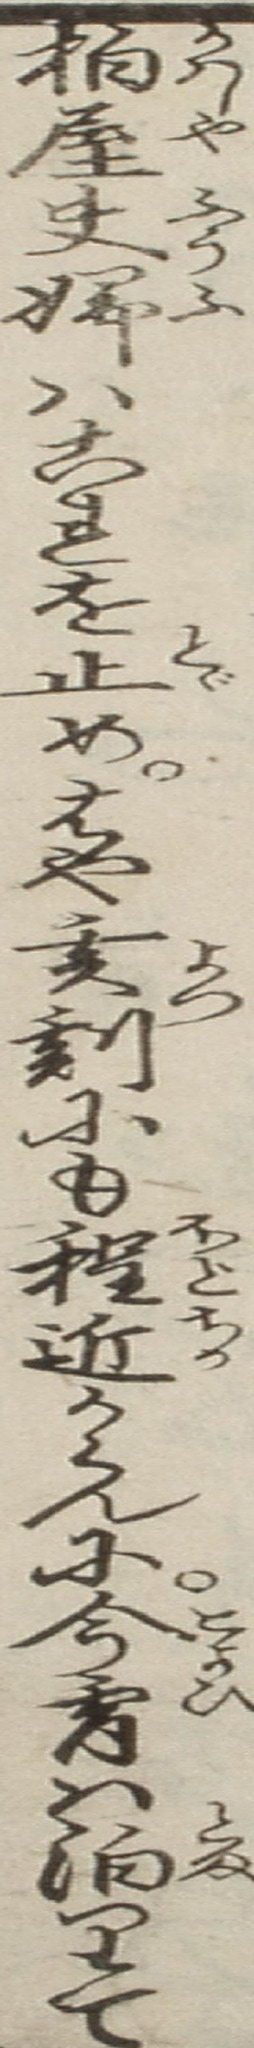柏屋夫婦はこれを止め。はや亥刻にも程近からんに。今宵は泊りて
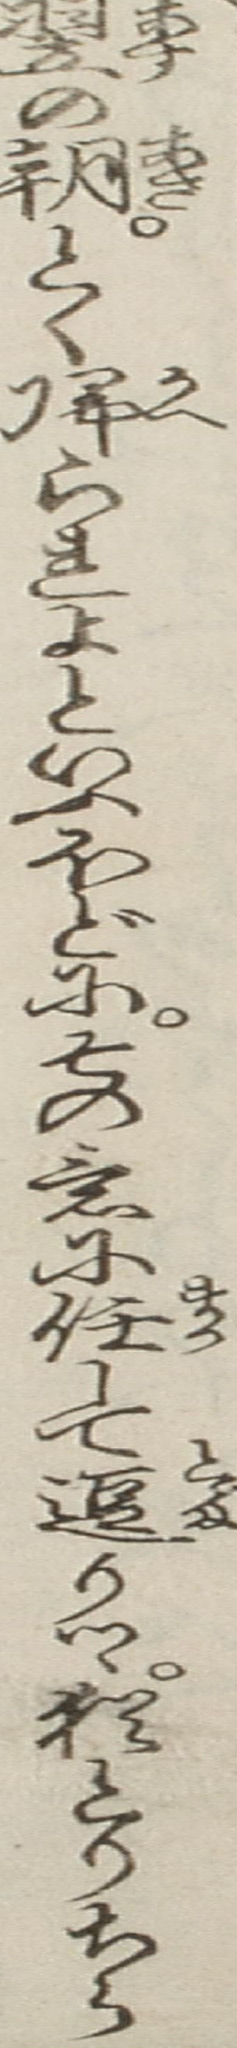翌の朝。とく帰られよといふほどに。その意に任して逗りつゝ。猶とりちら
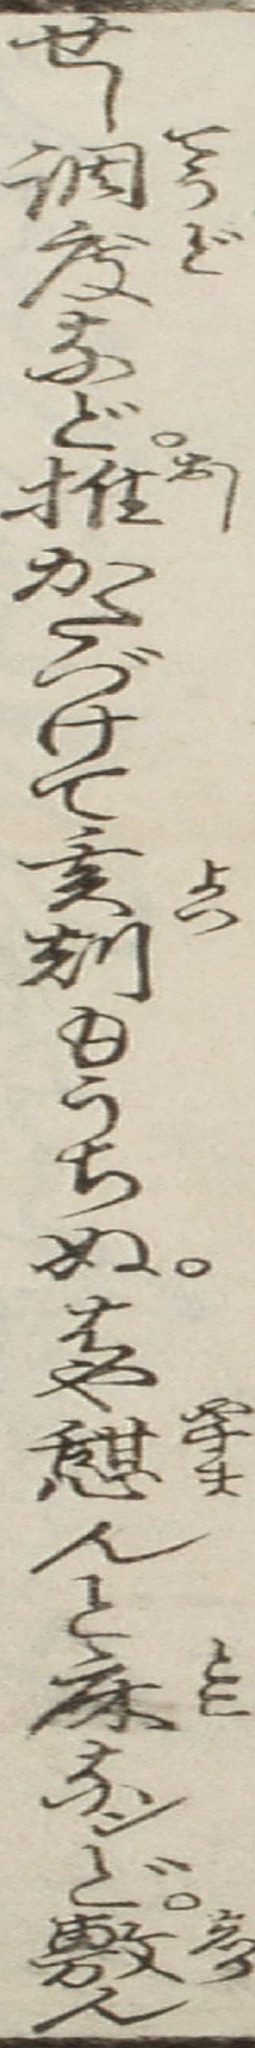せし調度など。推かたづけて亥刻もうちぬ。はや憩んと床なンど。敷ん
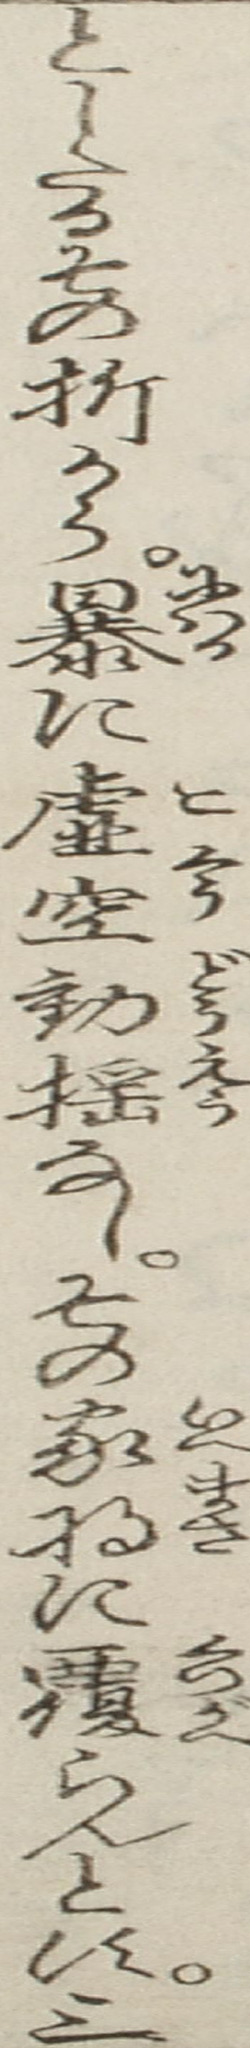としたるその折から。暴に虚空動揺なし。その家将に覆らんとす。三
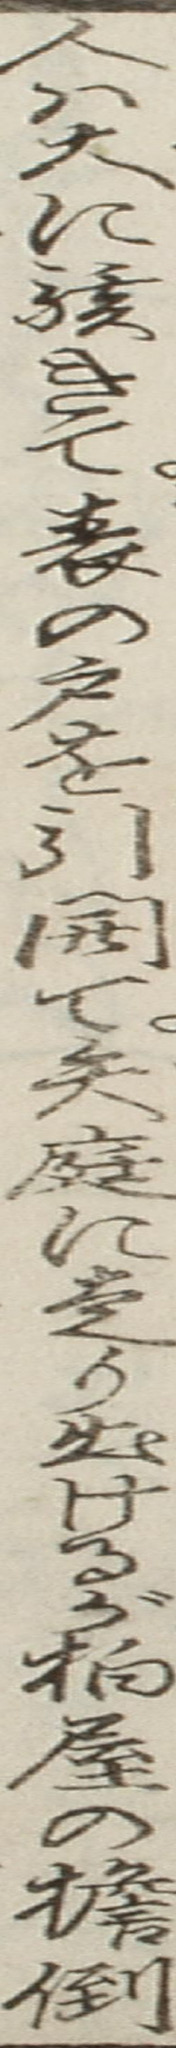人は大に駭きて。表の戸を引開て。矢庭に走り出けるが。柏屋の檐倒
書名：安政見聞録　上
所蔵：東京大学地震研究所図書室 Earthquake Research Institute Library, The University of Tokyo, JAPAN
